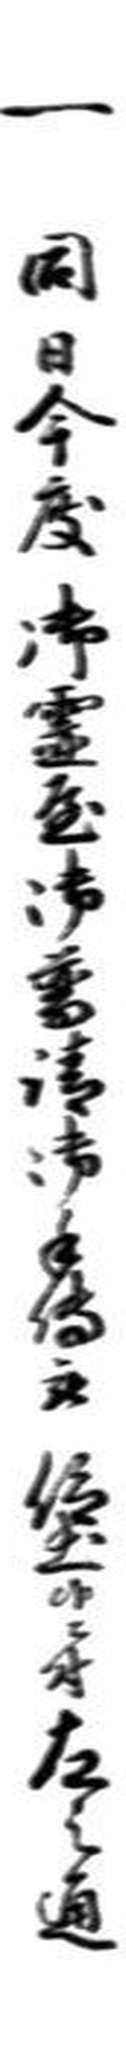一同日今度御霊屋御普請御手伝被仰出候ニ付左之通
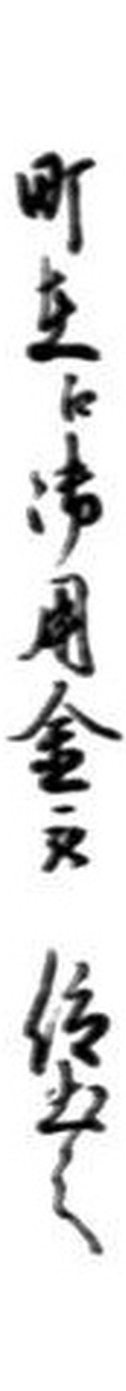町在江御用金被仰出之
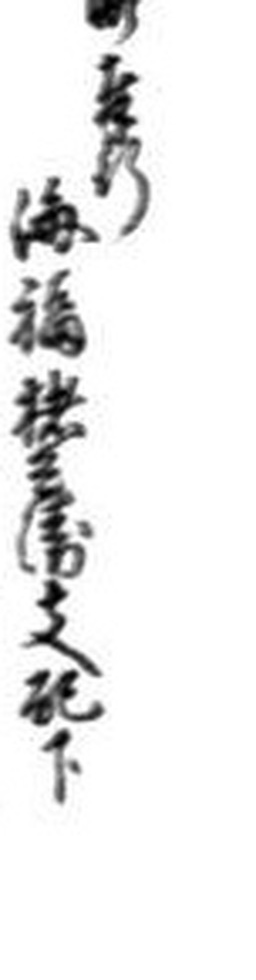海福猪兵衛支配下
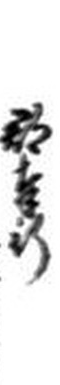町奉行
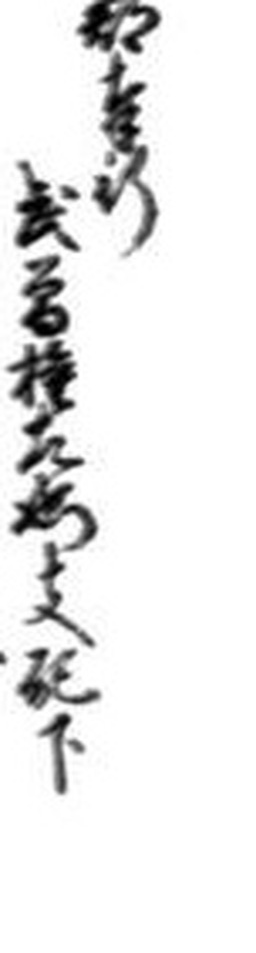武曽権左衛門支配下
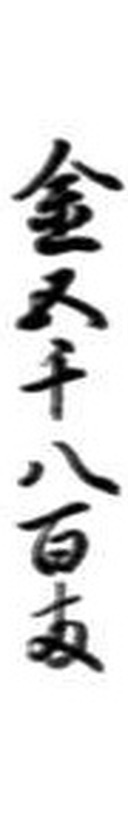金五千八百両上領

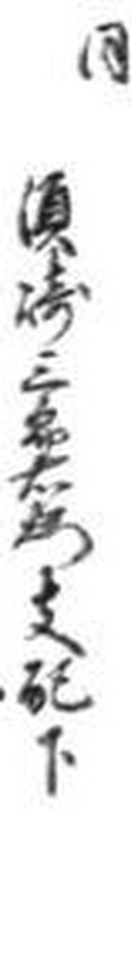須崎三郎右衛門支配下
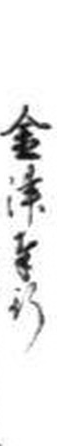金津奉行
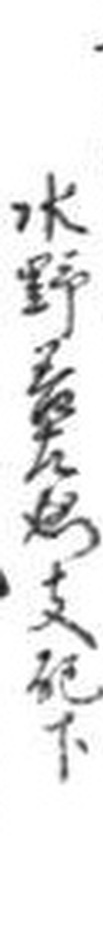水野善左衛門支配下
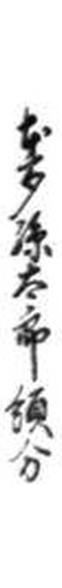本多孫太郎領分
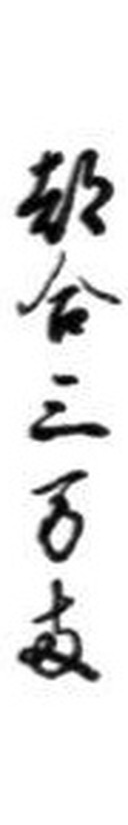都合三万両
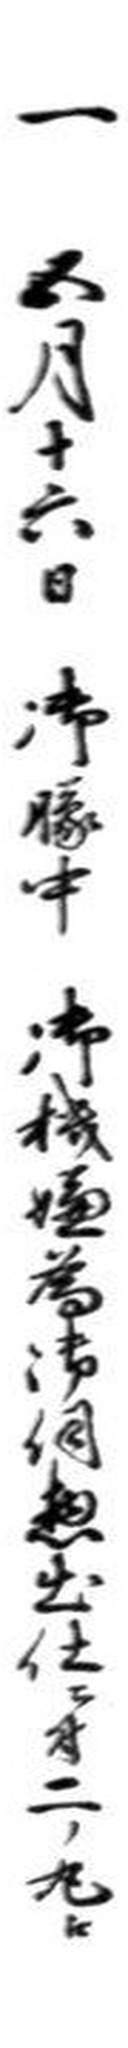一五月十六日御朦中御機嫌為御伺惣出仕ニ付二ノ丸江
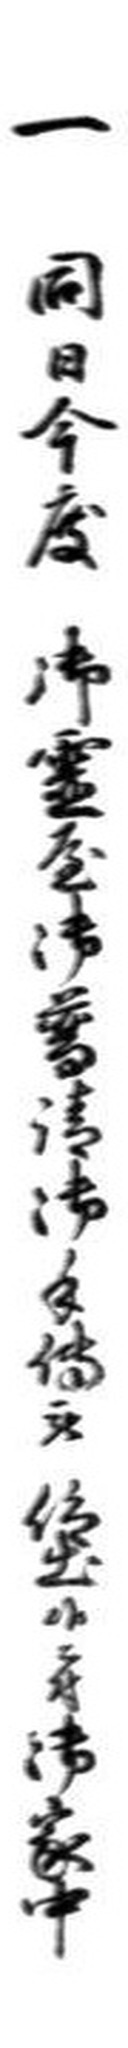一同日今度御霊屋御普請御手伝被仰出候ニ付御家中
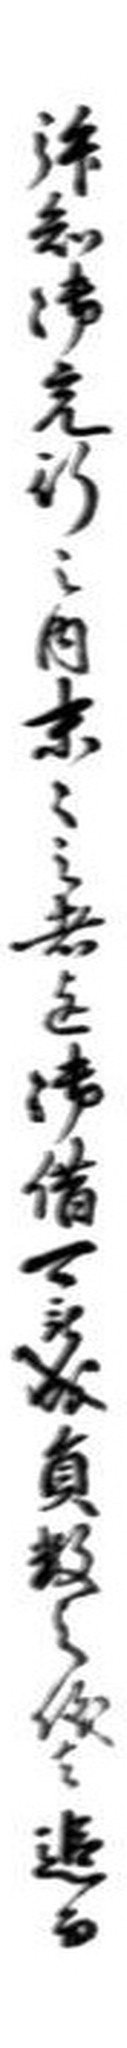拝知御充行之内末々之者迄御借可被成員数之儀者追而
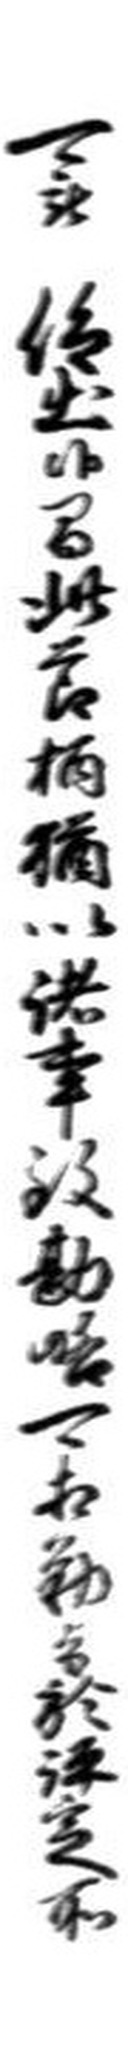可被仰出候間此節柄猶以諸事致勘略可相勤旨於評定所
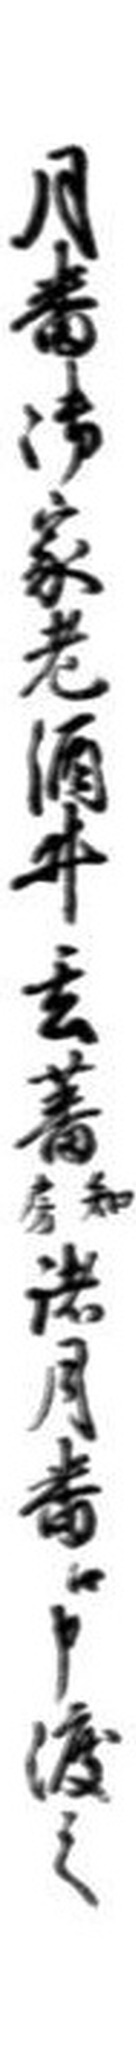月番御家老酒井玄蕃知房諸月番江申渡之
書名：家譜 三十一 吉邦公 享保元年
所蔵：福井県文書館 Fukui Prefectural Archives
